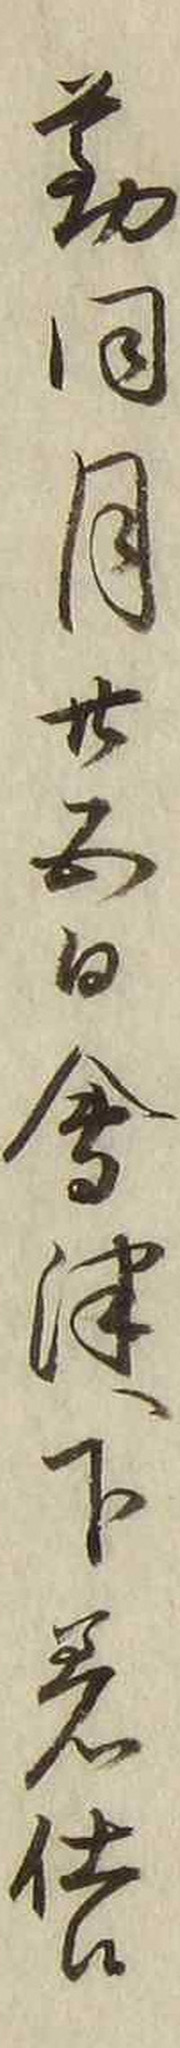勤同月廿五日会津へ下着仕候

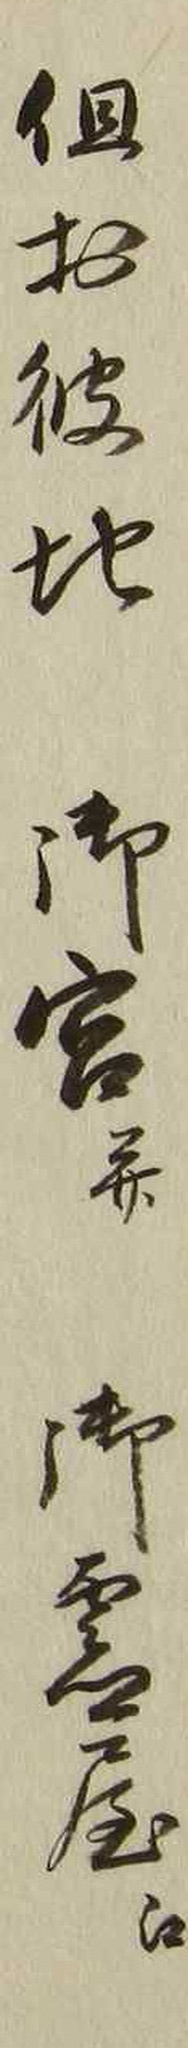但於彼地御宮并御霊屋江
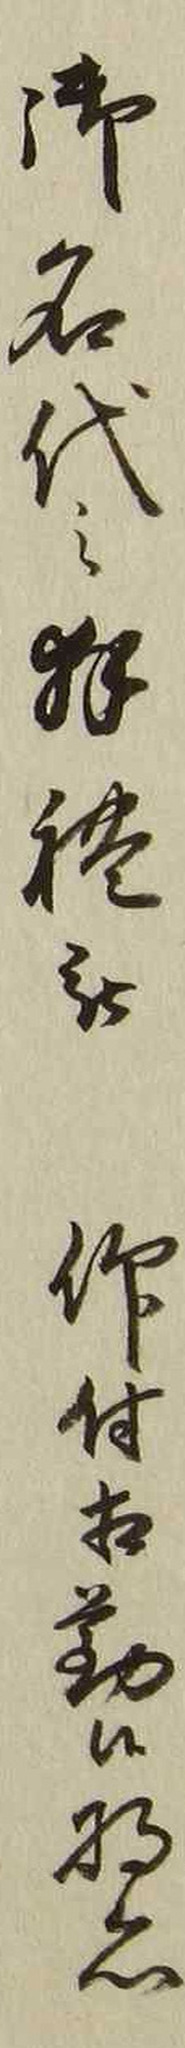御名代之拝礼被仰付相勤候得は
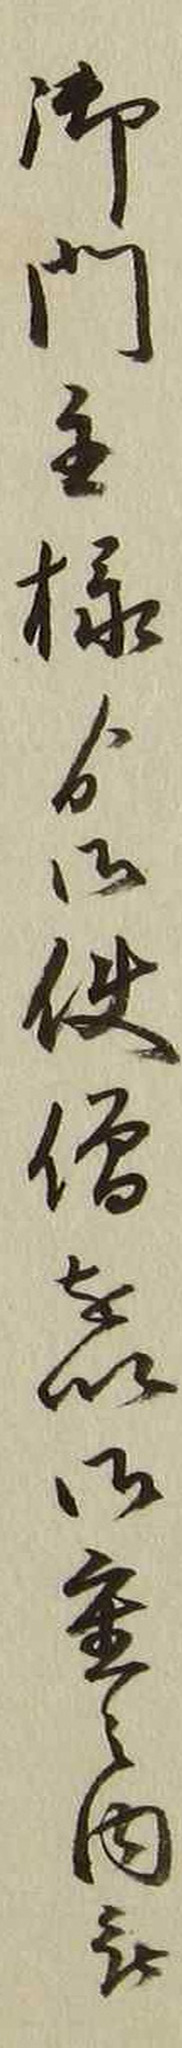御門主様ゟ御使僧を以御重之内被
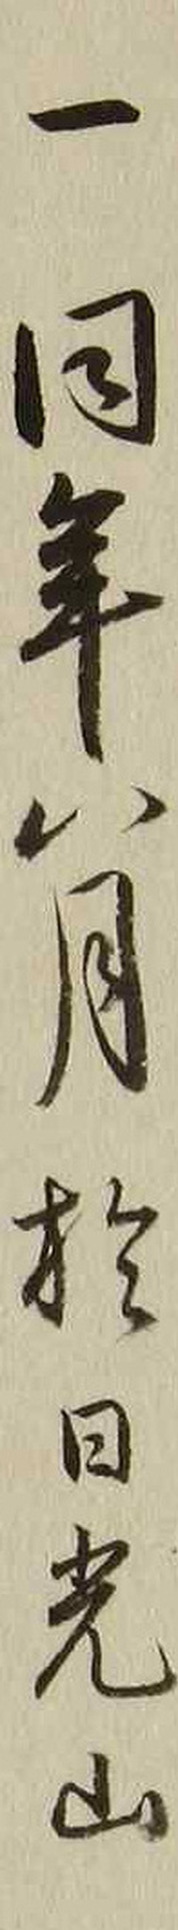一同年八月於日光山
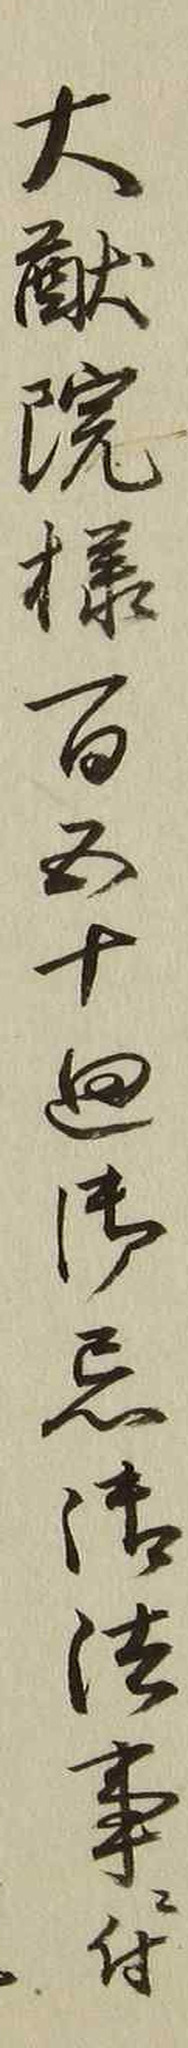大猷院様百五十回御忌御法事に付
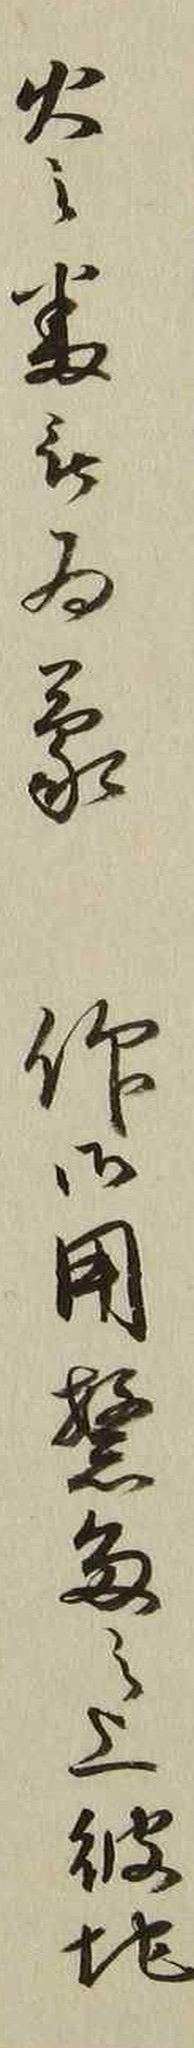火之番被為蒙仰御用繁多之上彼地
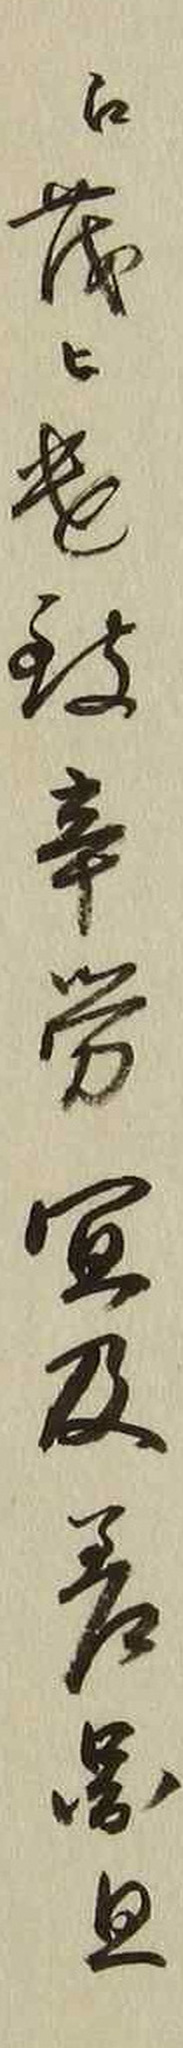江も被遣致辛労宜及指図且
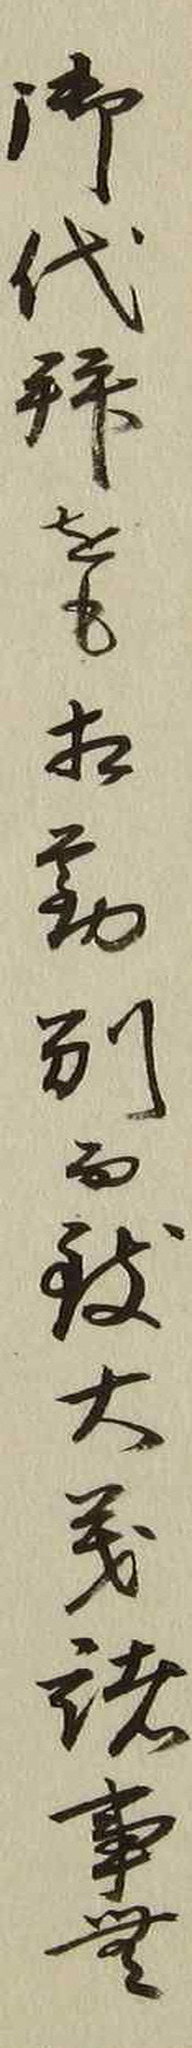御代拝をも相勤別而致大義諸事無
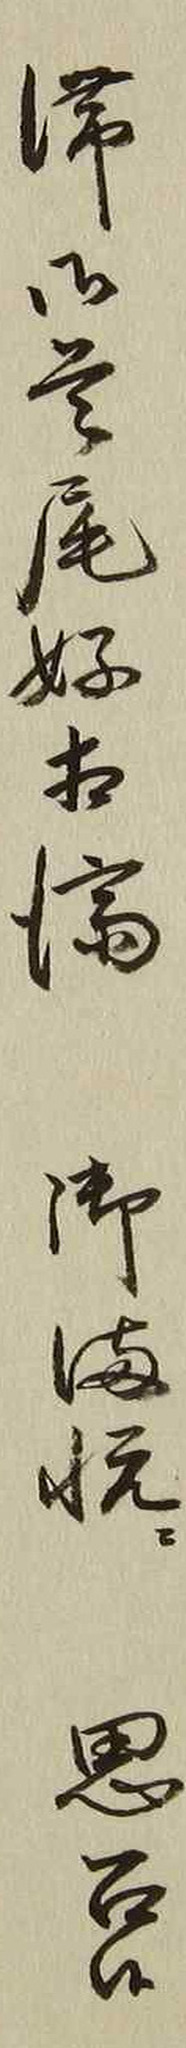滞御首尾好相済御満悦に思召候
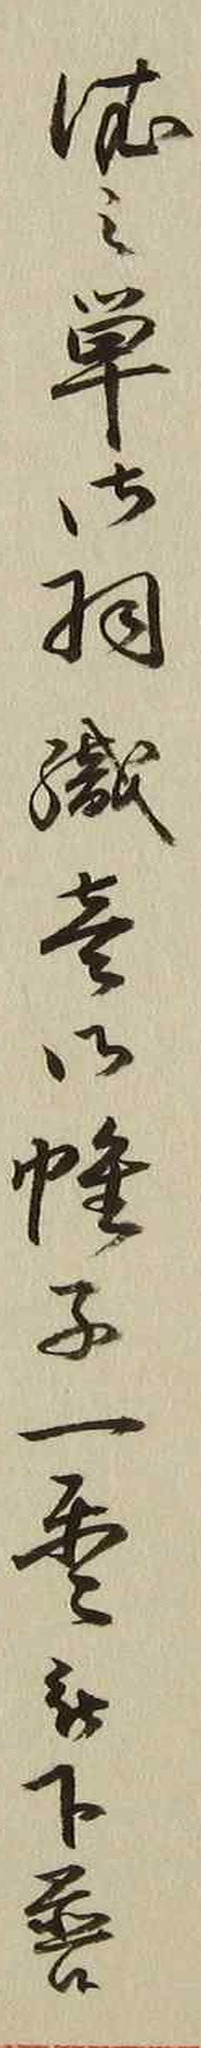依之単御羽織壱御帷子一重被下置候
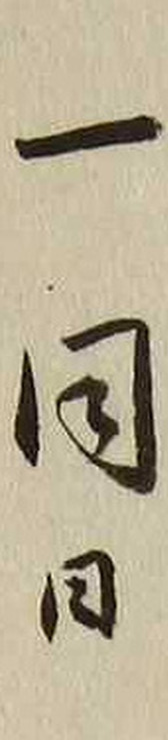一同日
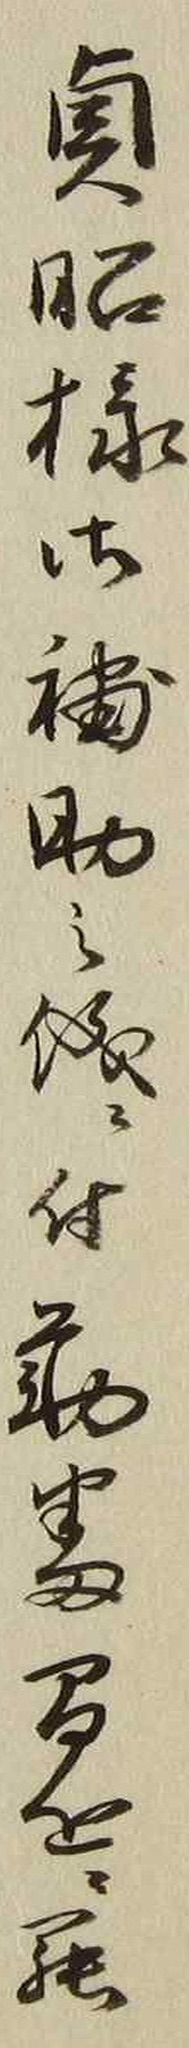貞昭様御補助之儀に付勤番間近に罷
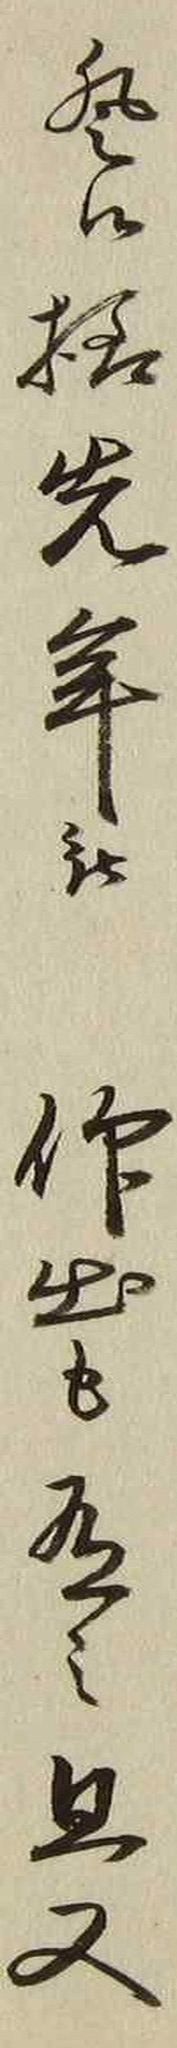登候様先年被仰出も有之且又
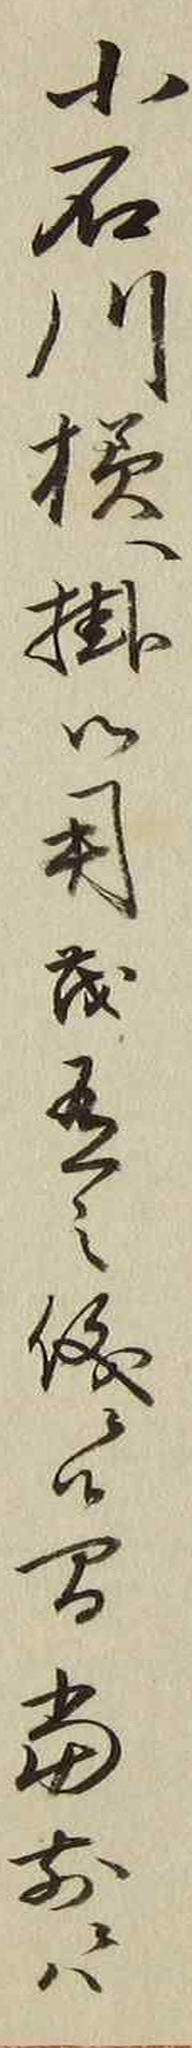小石川様へ掛御用も有之儀に候間当前には
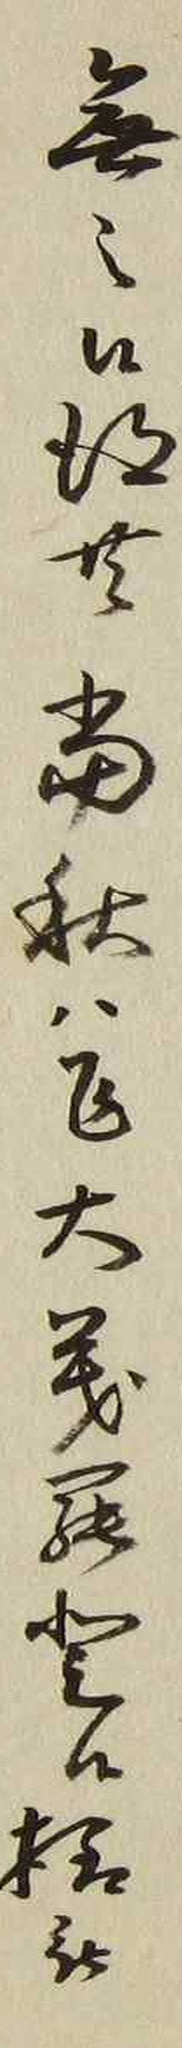無之候得共当秋は乍大義罷登候様被
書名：諸士系譜　巻之125　た之部1
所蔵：会津若松市立会津図書館
